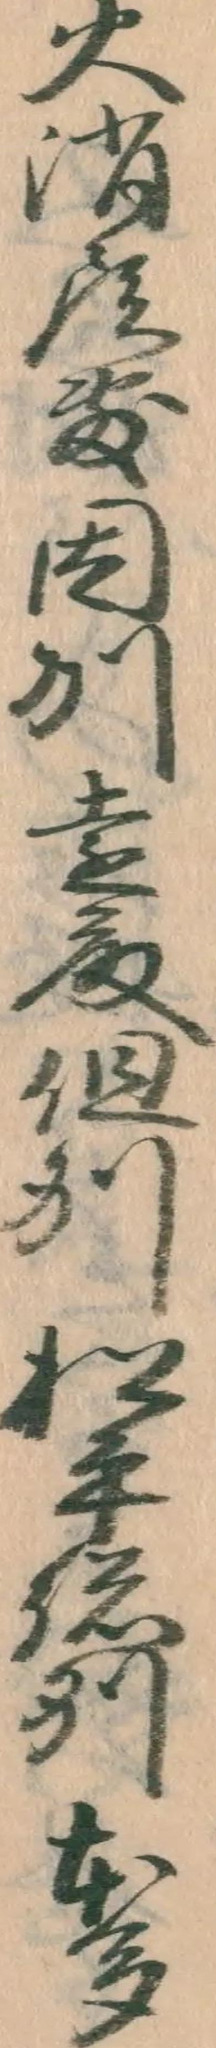火消屋敷因州遠藤但州松平総州本多
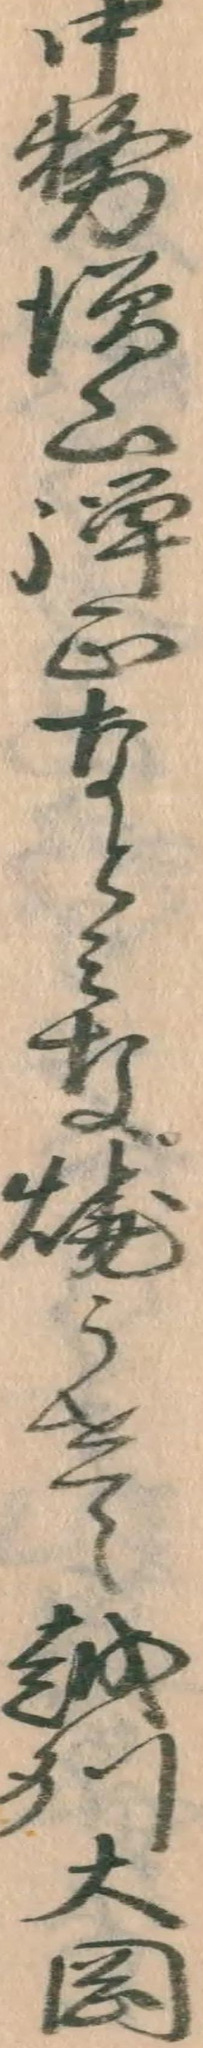中務増山弾正なとミな燒うせて越州大岡
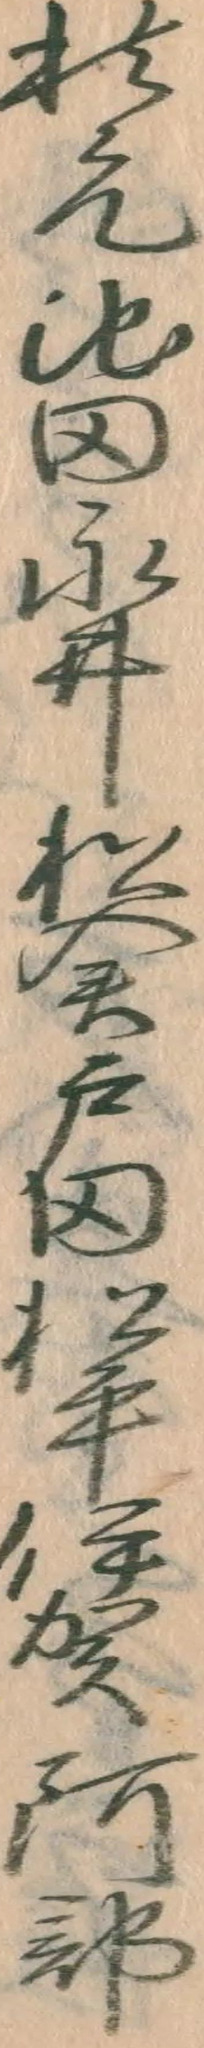秋元池田永井松倉戸田松平伊賀阿部
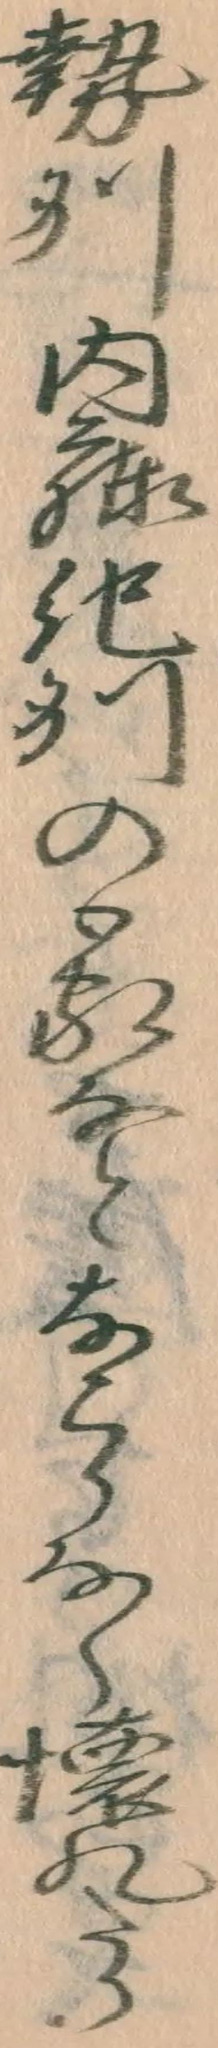勢州内藤紀州の御家なとなこりなく壊れたり
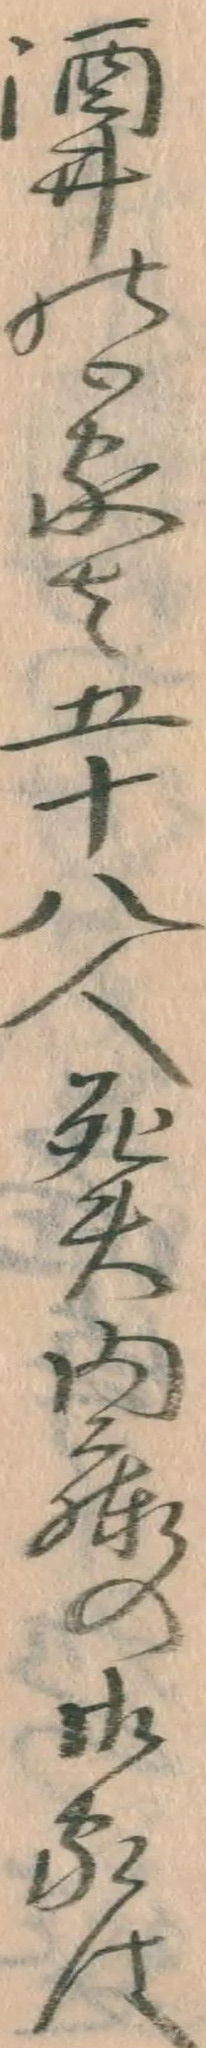酒井の御家は五十八人死失内藤の御家は
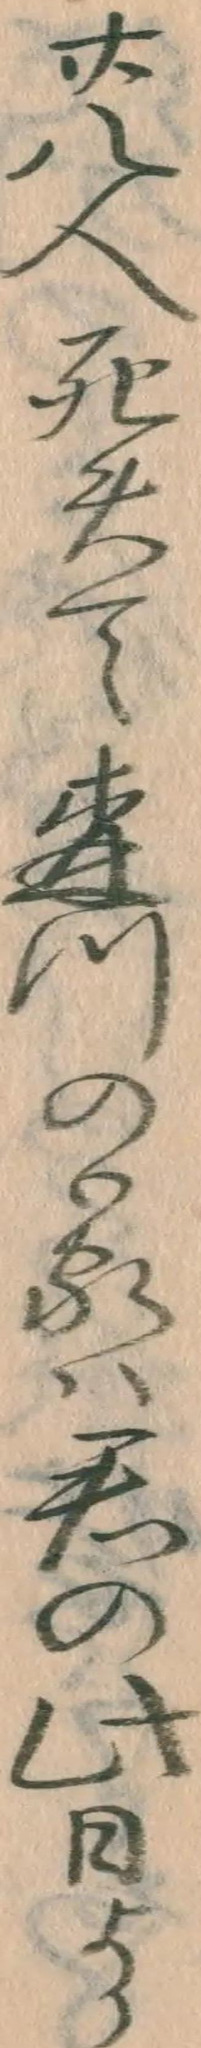廿八人死失て森川の御家ハ君の此日より
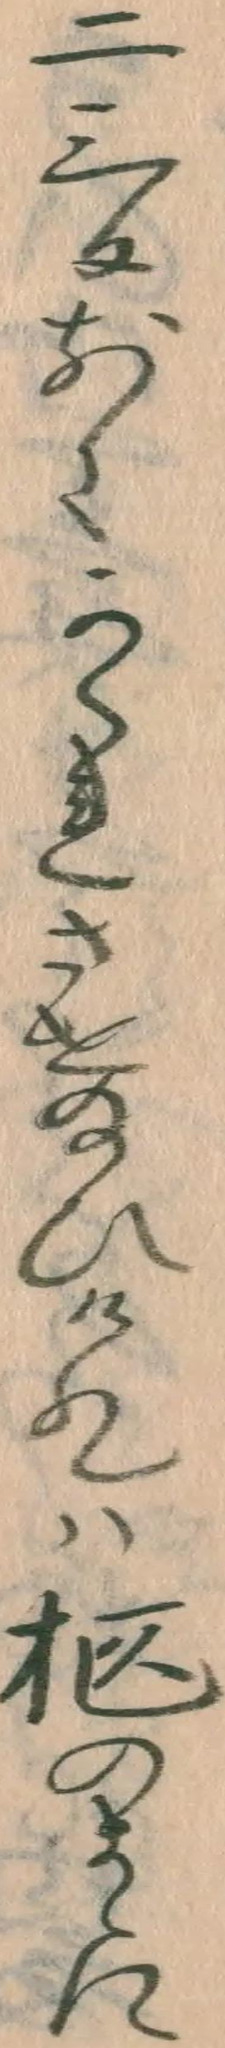二三日前にかくれさせ玉ひけれハ柩のまゝに
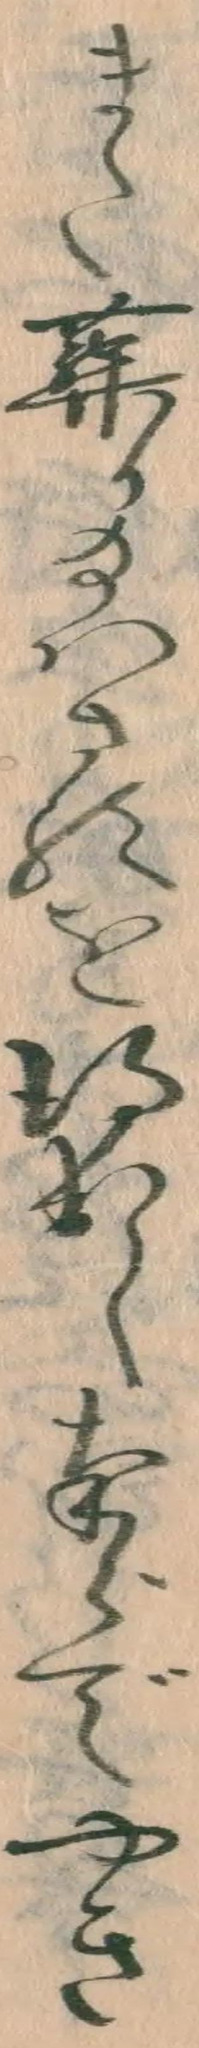また葬リ玉ハさるを得出し奉らでやき
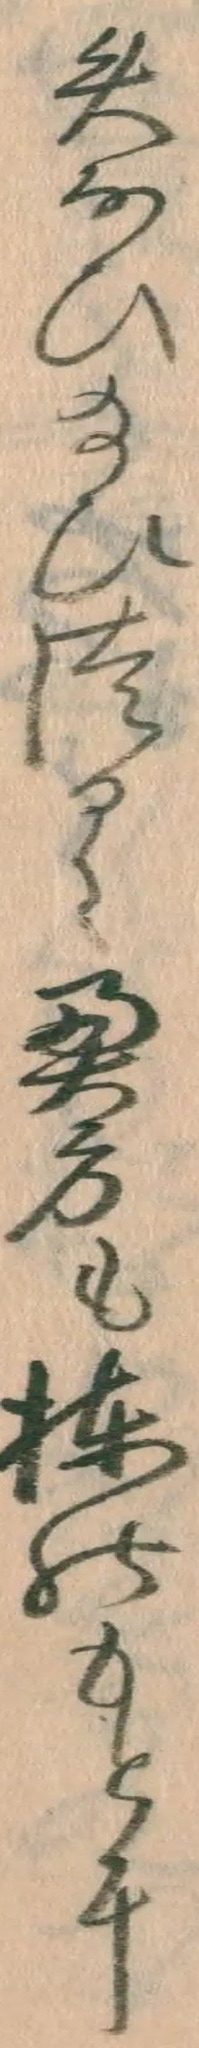失なひ玉ひつるに奥方も棟のもとに
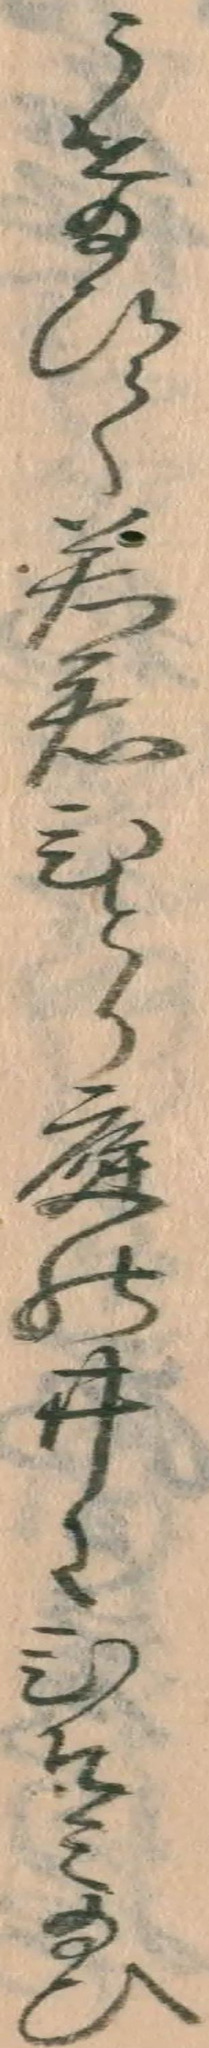うせ玉ひて若君ひとり庭の井にひそミ玉ひ
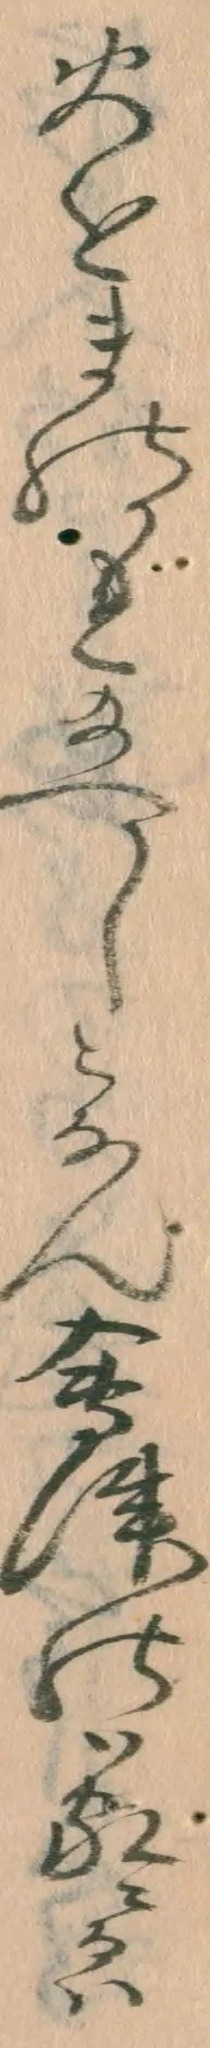火をまのかれ玉へしとなん會津の御家ニ而ハ
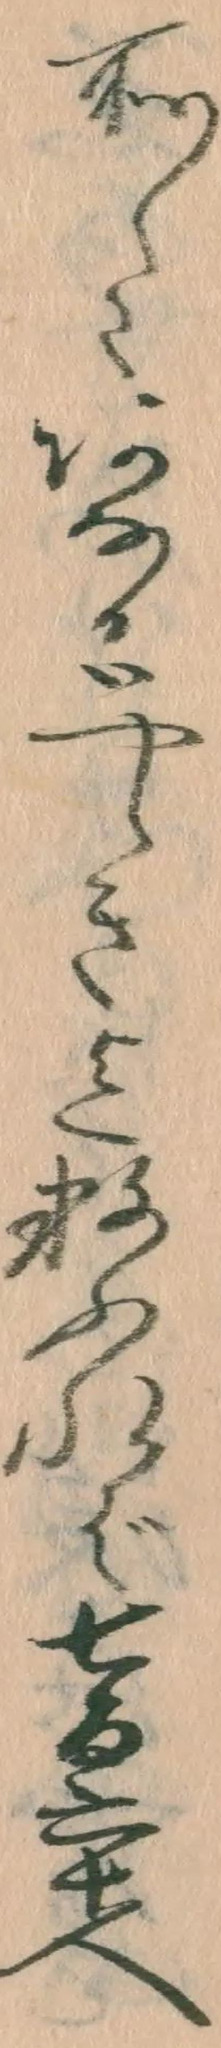所〳〵にあなる御やしき迄数ふれば七百六十人
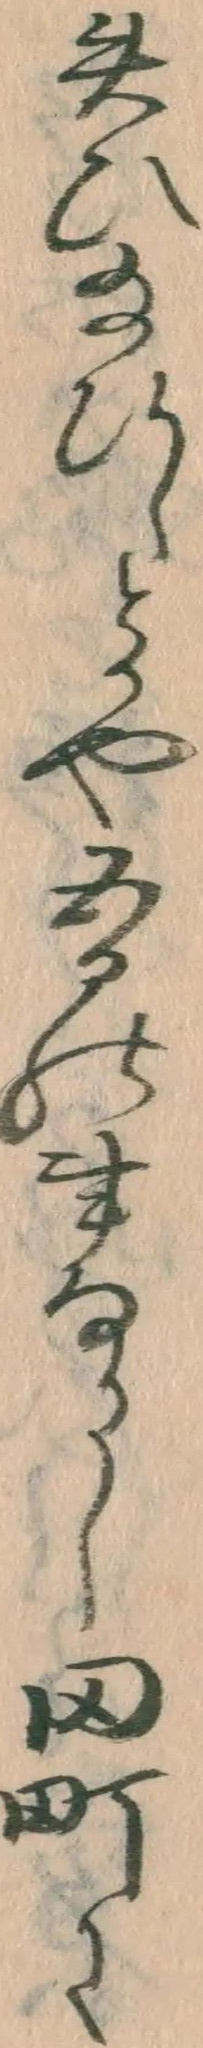失ひ玉ひしとかや五日の事なりし田町に
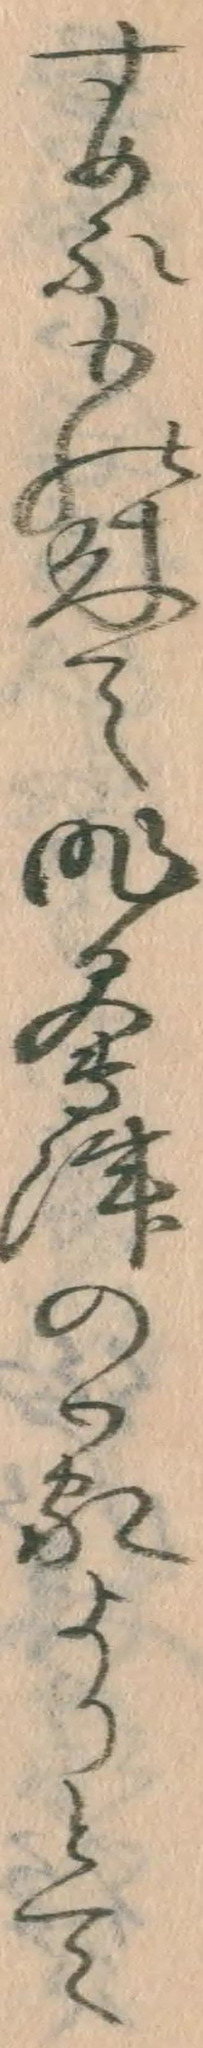すめるもの来て昨日會津の御家よりとて
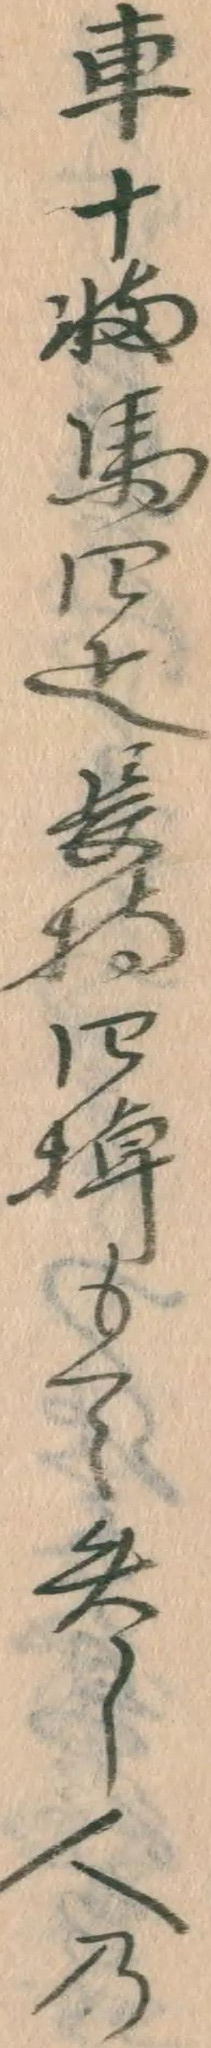車十輌馬四疋長持四棹もて失し人の
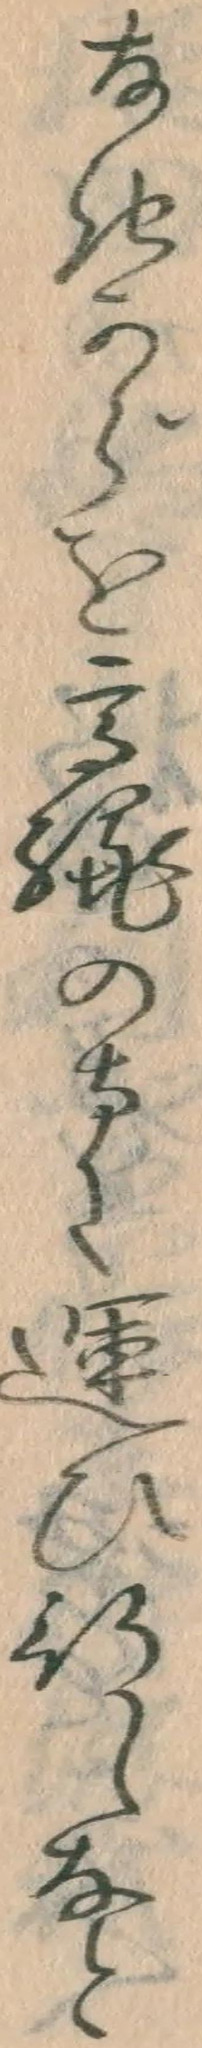なきからを高縄の寺に運ひ行しなと
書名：麗斎叢書. 20
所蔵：国立国会図書館 National Diet Library, JAPAN
